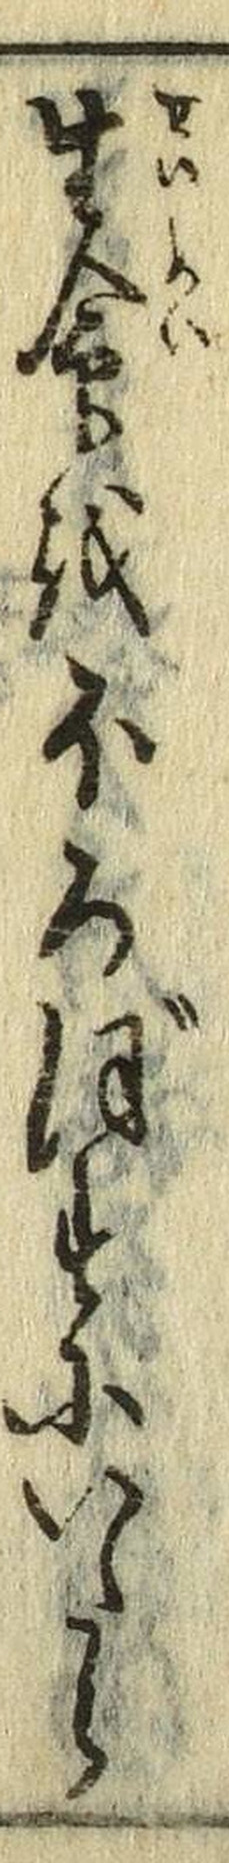生会をほろぼすにいたら
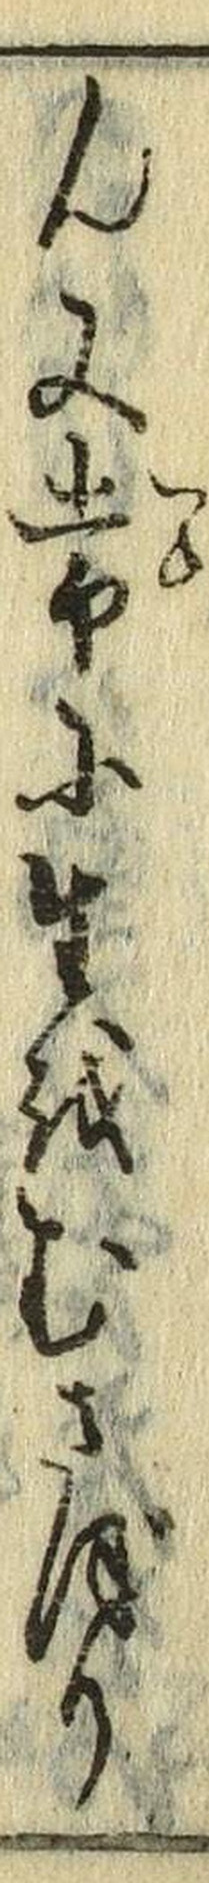ん又常に生をむさぼり
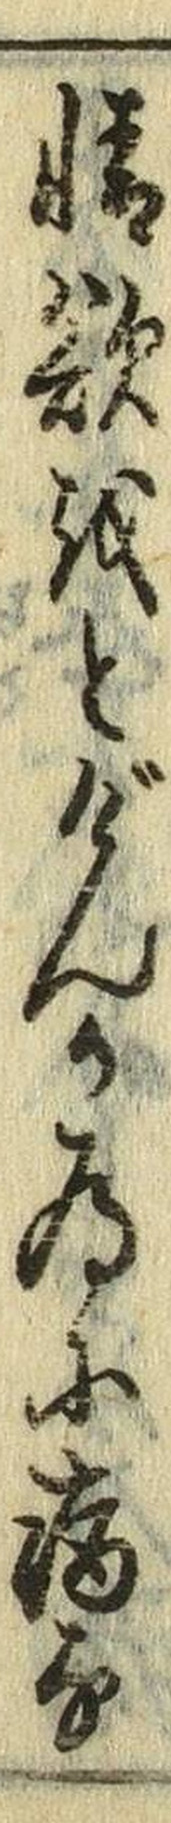情欲をとげんか為に病な
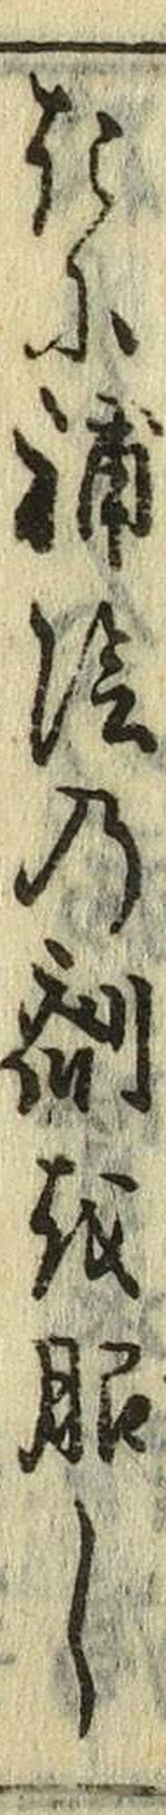きに補陰の剤を服し
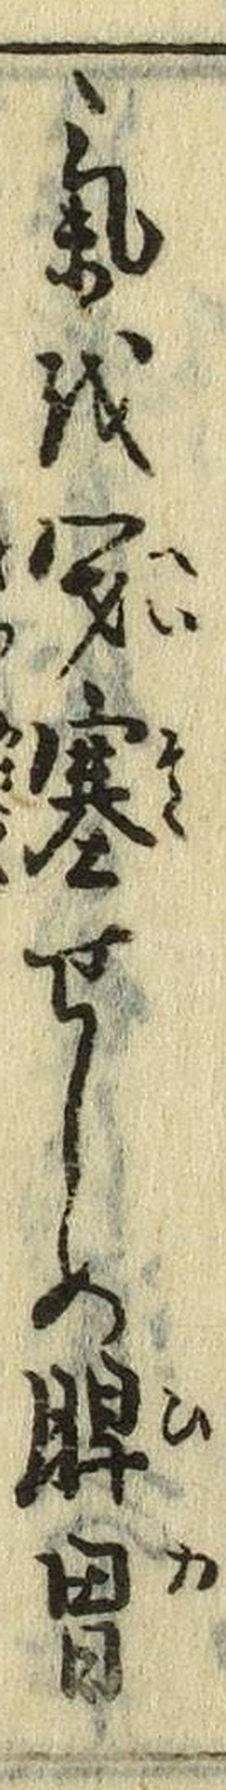気を閉塞せしめ脾胃
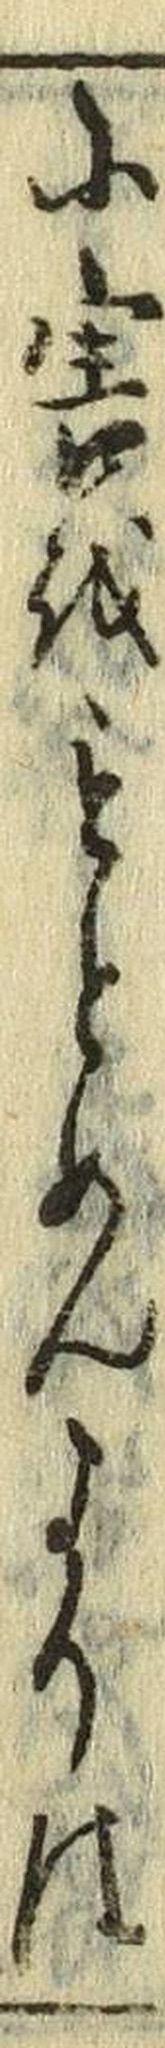に害をもとめんよりは
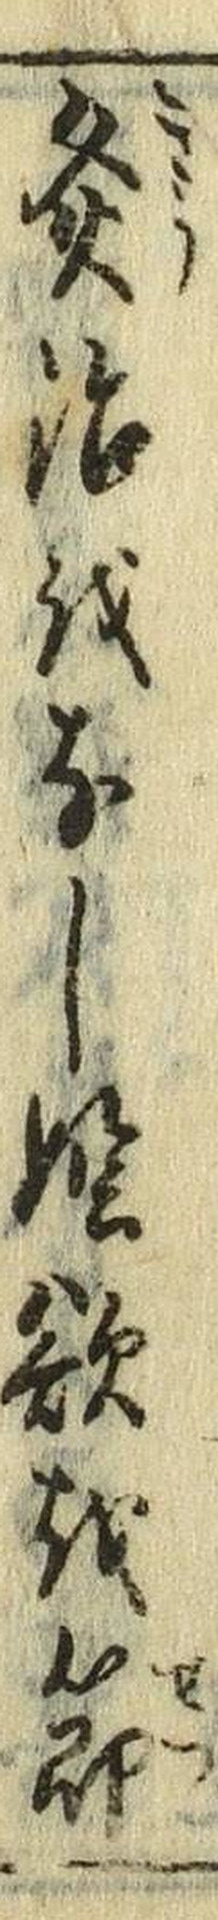灸治をなし婬欲を節
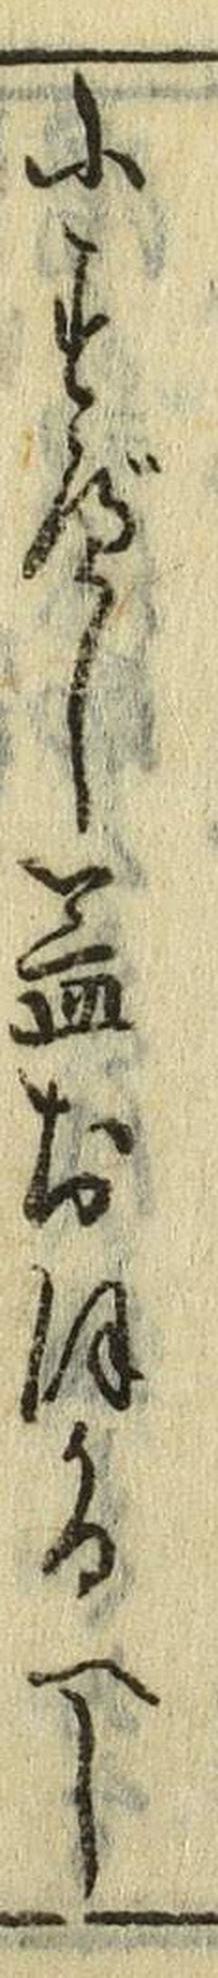にすべし益おほかるへし
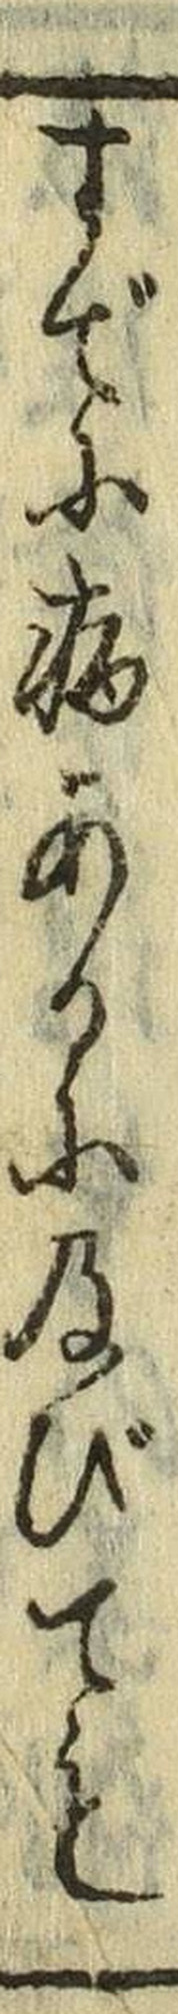すでに病あるに及びても
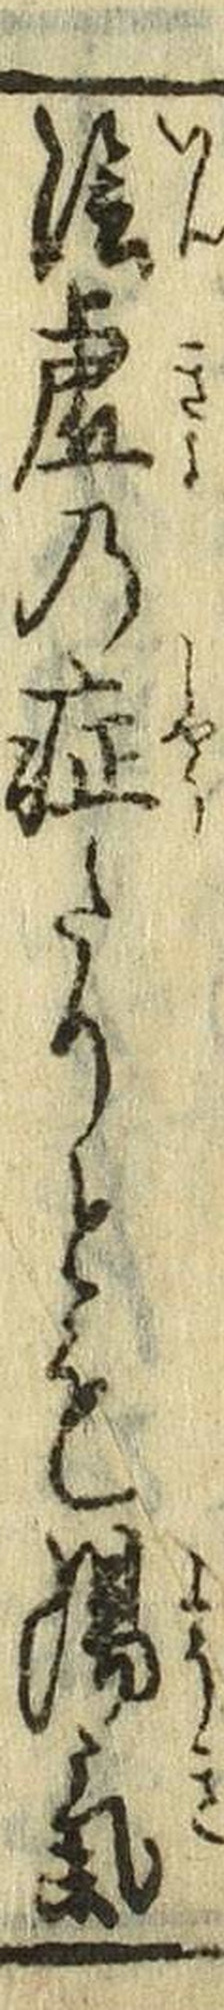陰虚の症たりとも陽気
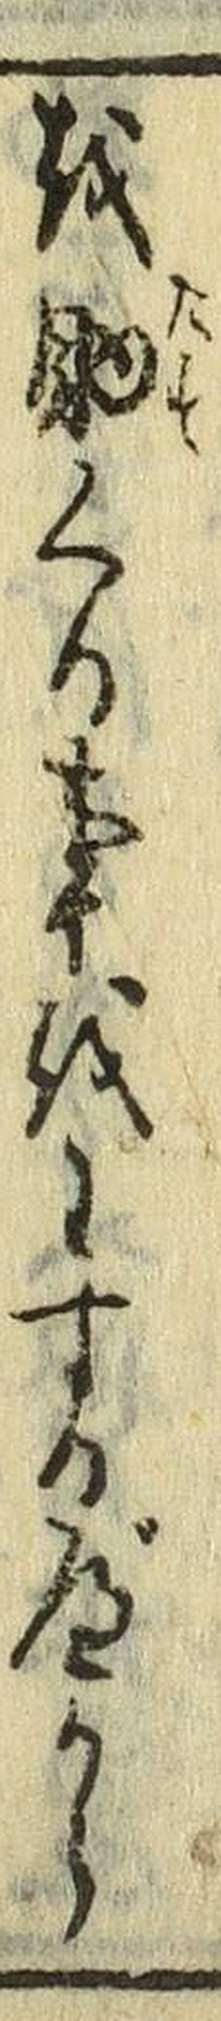を助くる事をわするべから
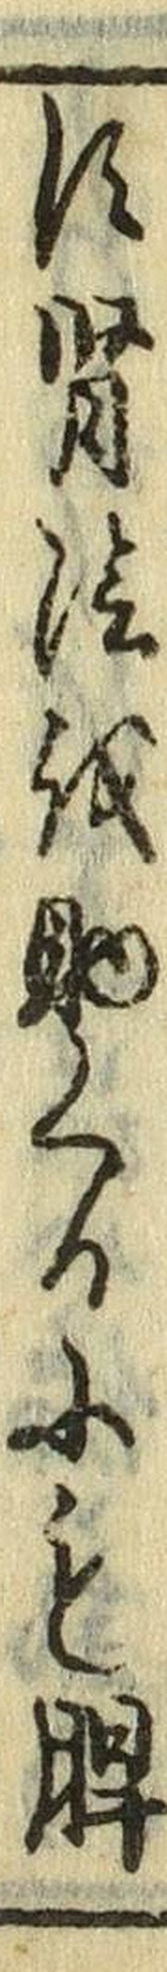す腎陰を助くるにも脾
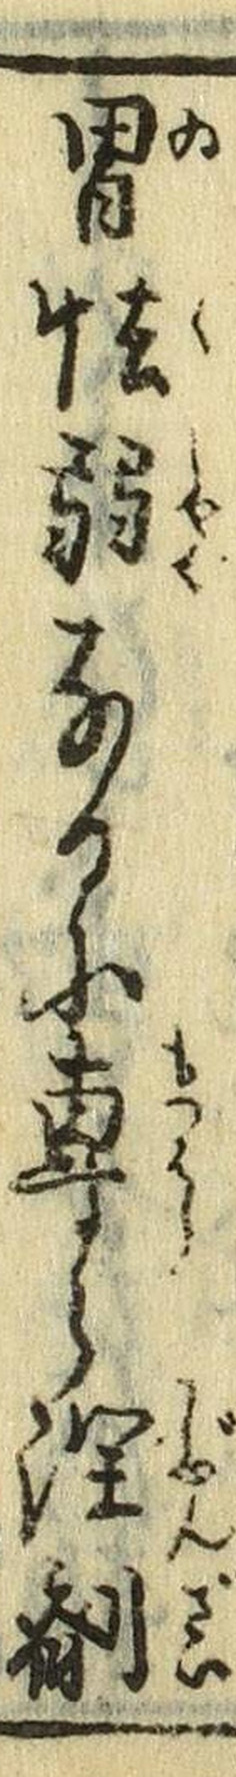胃怯弱なるに専ら潤剤
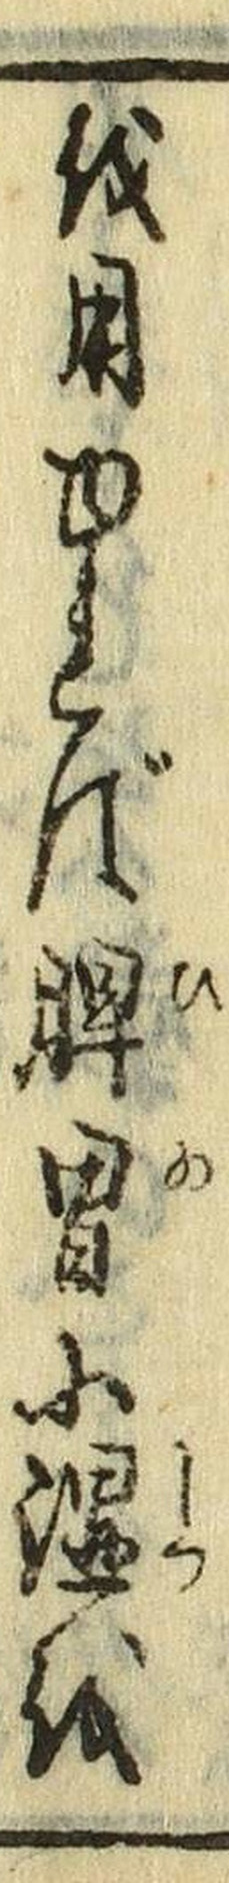を用ゆれば脾胃に湿を
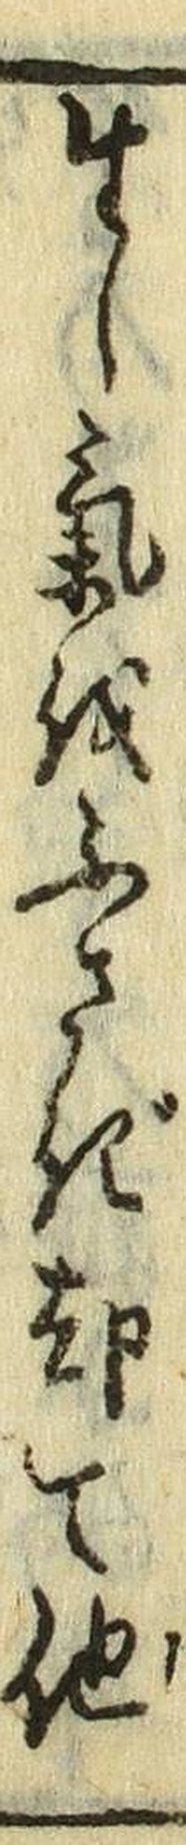生し気をふさぎ却て他
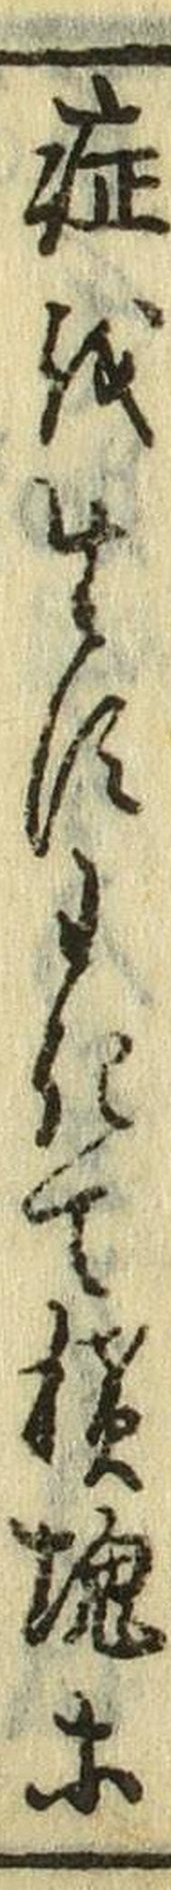症を生すわきて積塊等
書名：居家養生記
